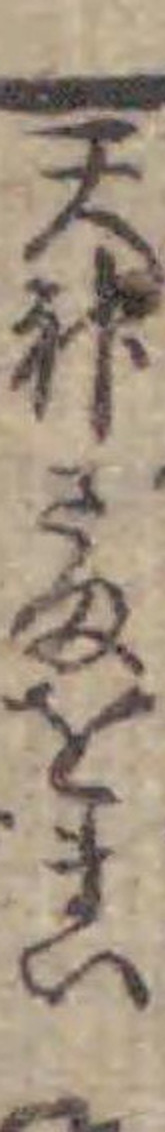天神さまをまい
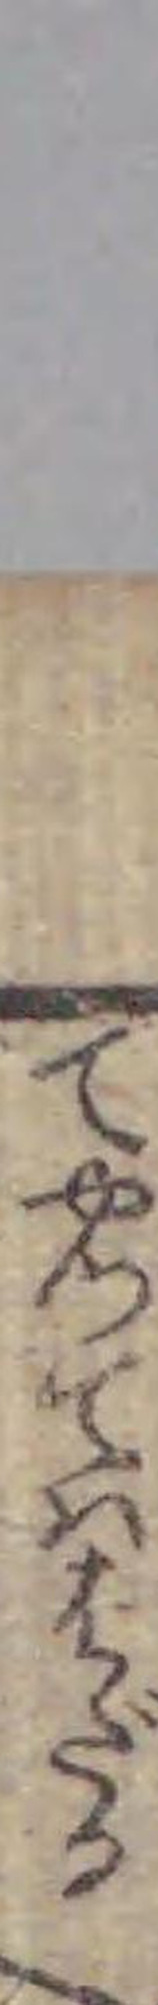てやつてははだか
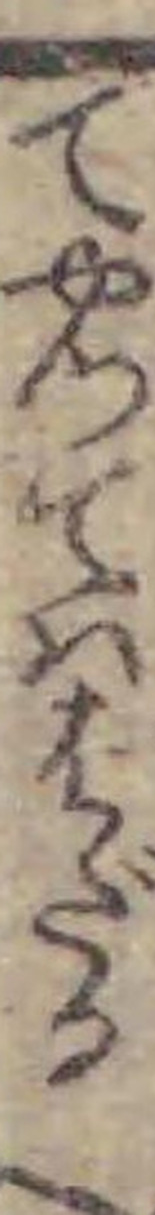てやつてははだか
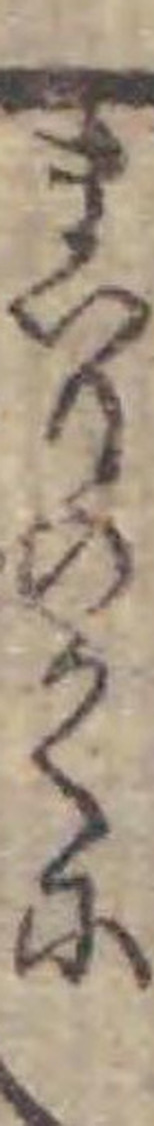まいりのかくに
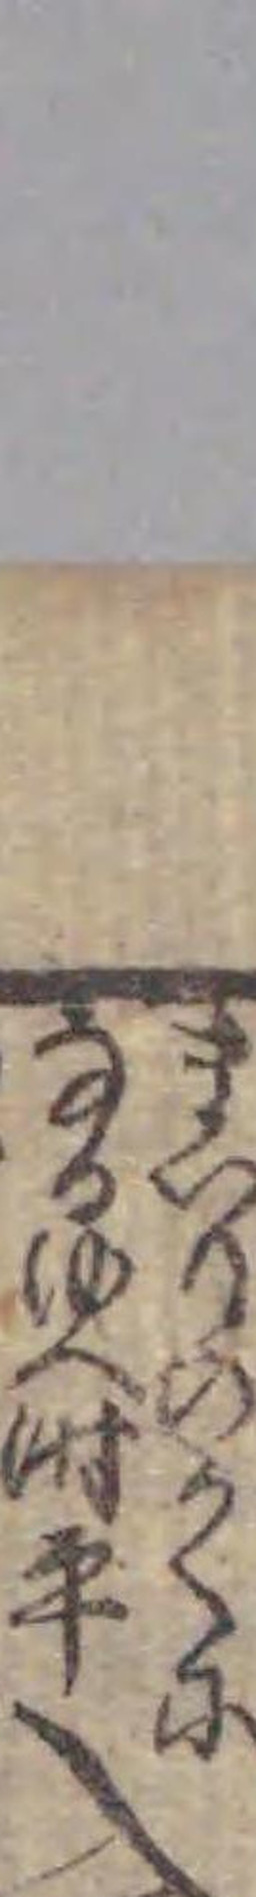なるゆへ時平
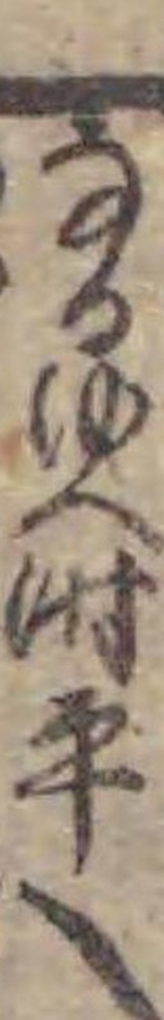なるゆへ時平
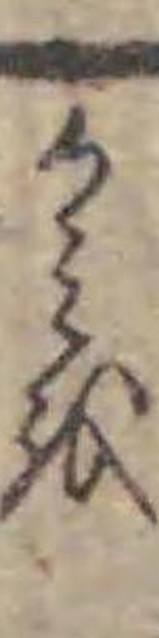かみを
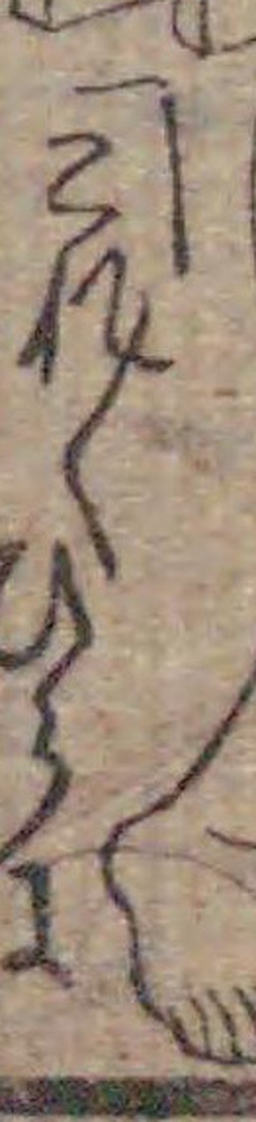〽これ〳〵ひらに
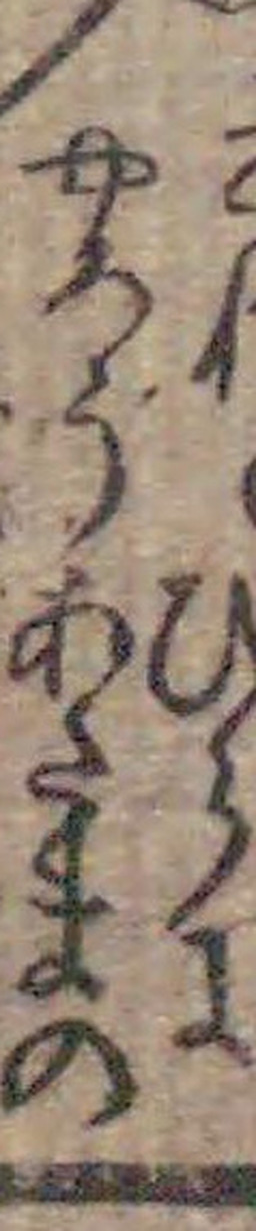やろうあたまの
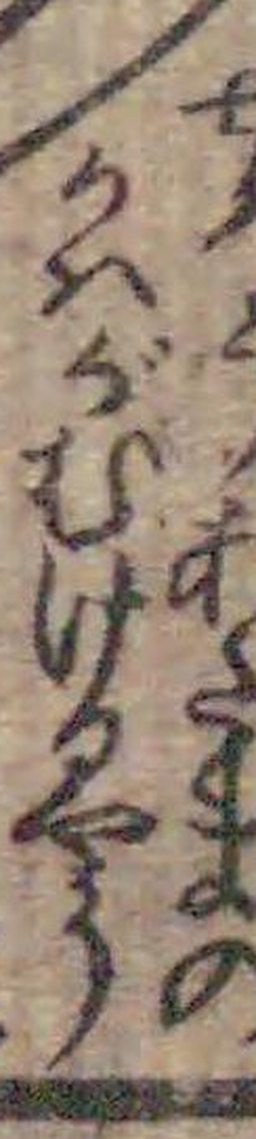かはがむけるやうに
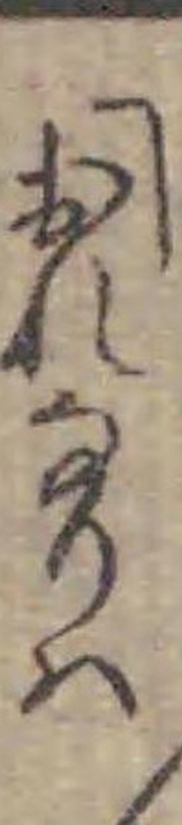〽おれなりは
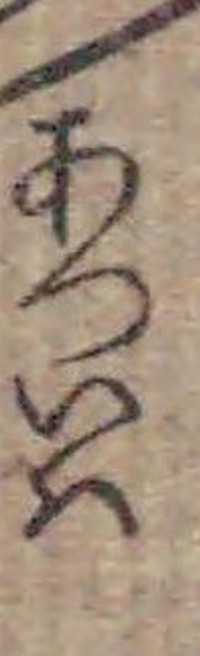あついは
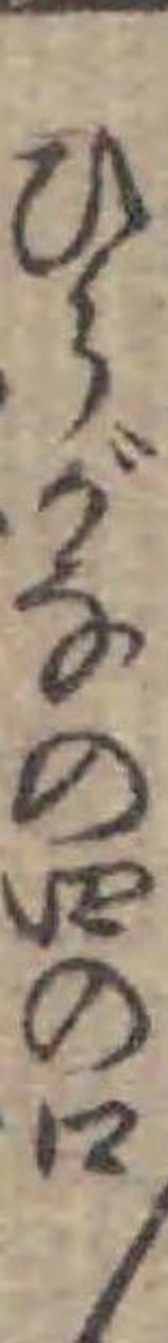ひらがなの四の口
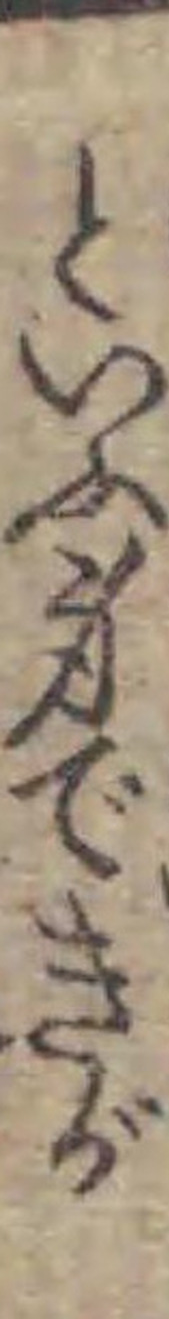といふ身できが
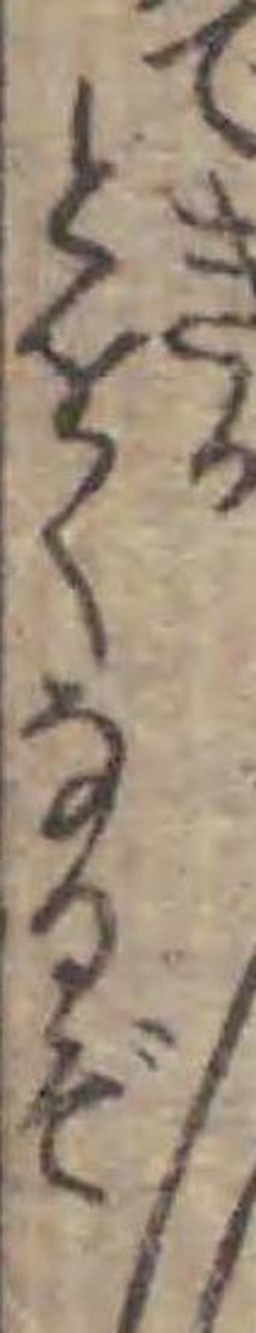とをくなるぞ
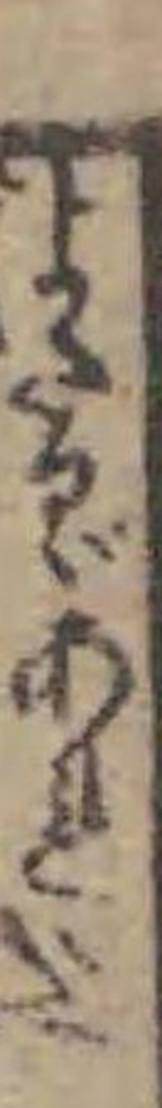よたかゞあれ
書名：本樹真猿浮気噺 : 3巻
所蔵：国立国会図書館 National Diet Library, JAPAN
